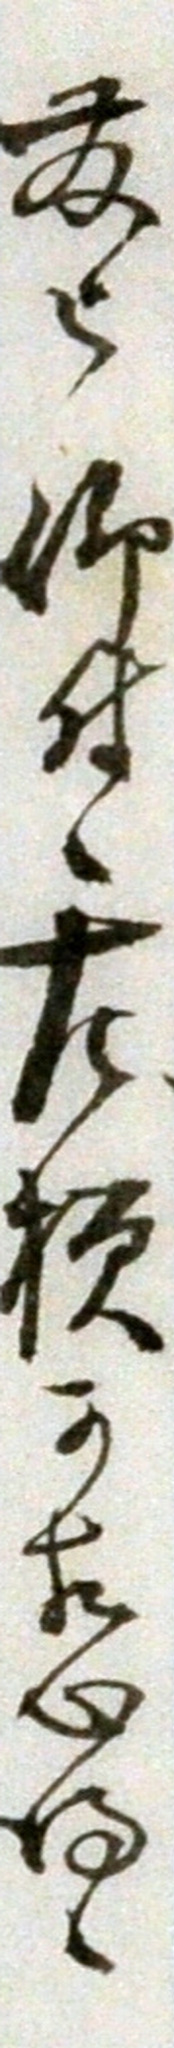散被仰付候左様可相心得候
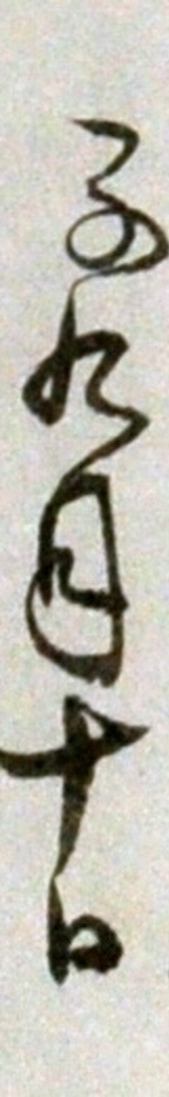子九月十日
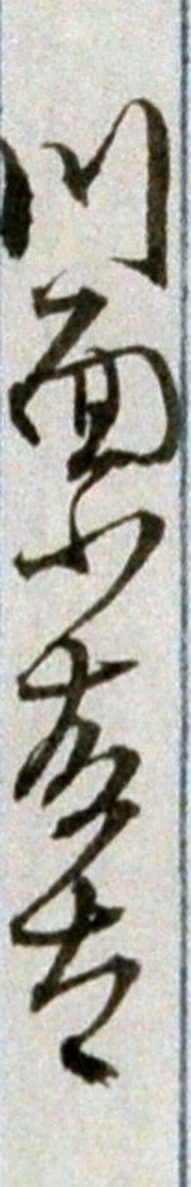川面小藤太
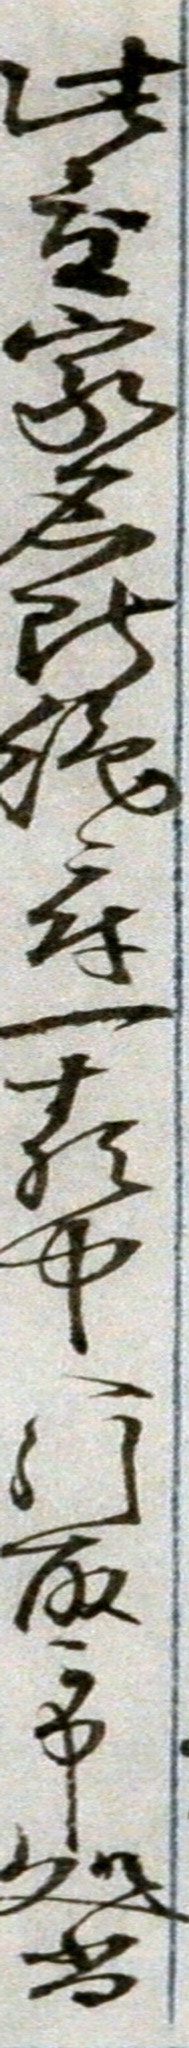此度家名断絶ニ付一類中へ引取可申処尚
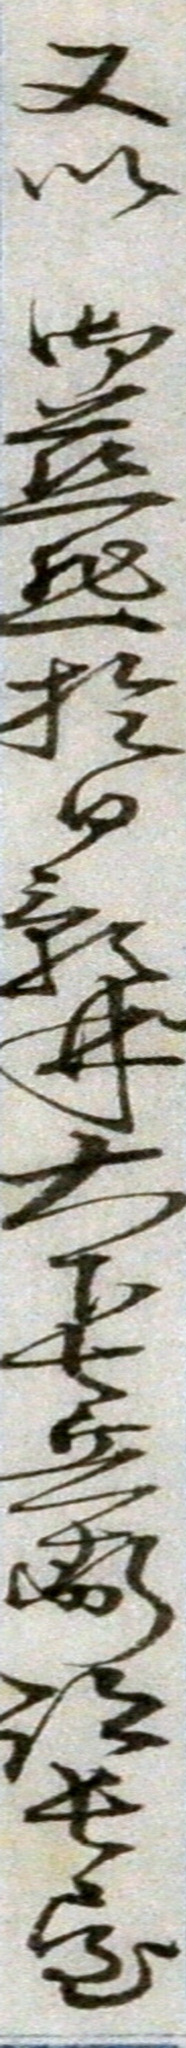又以御慈悲於日影林大下七兵衛跡長屋
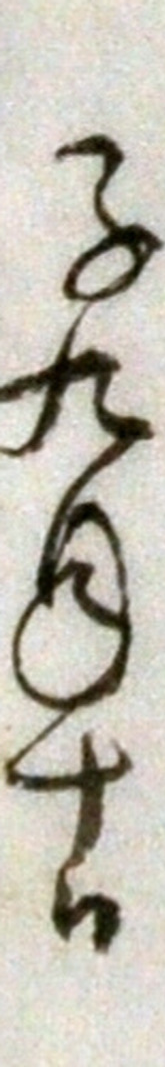子九月十日
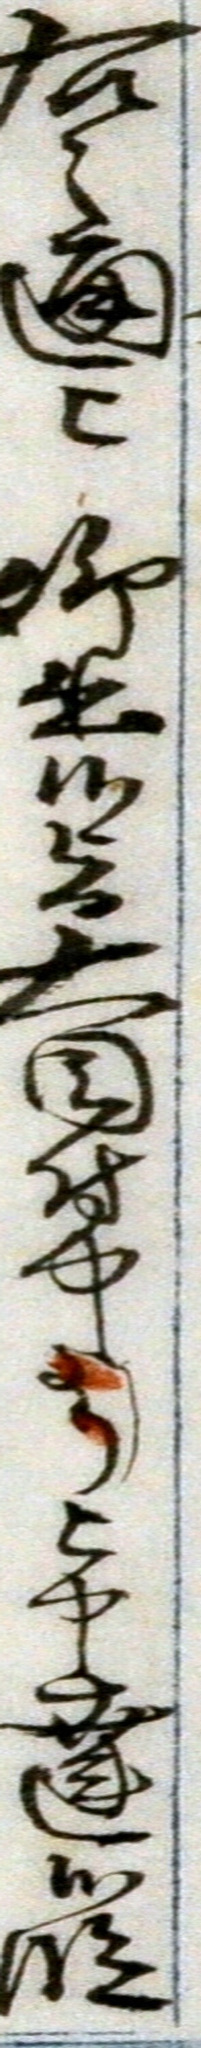右之通被仰出候旨大目付中より被申達候段
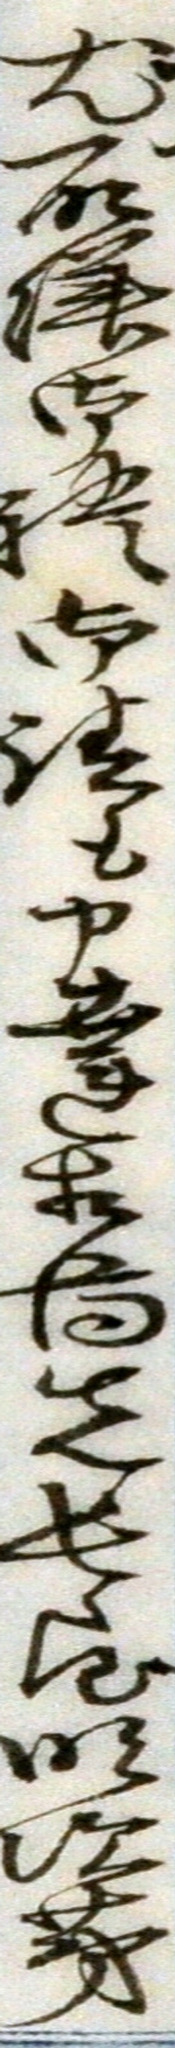尤取繕御礼御請も申達相済先長屋明次第
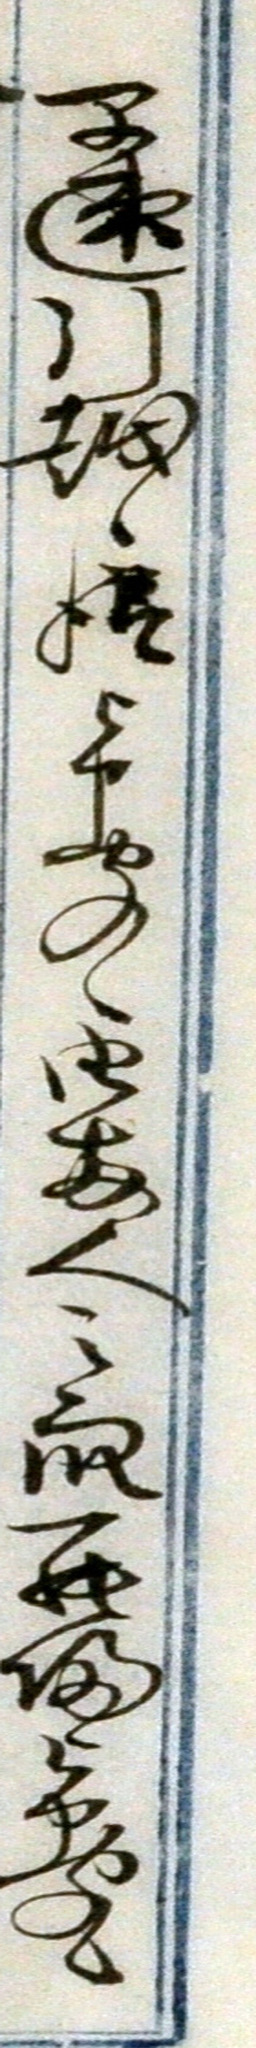早速引越候様被申聞候由両人之衆罷帰被申聞候
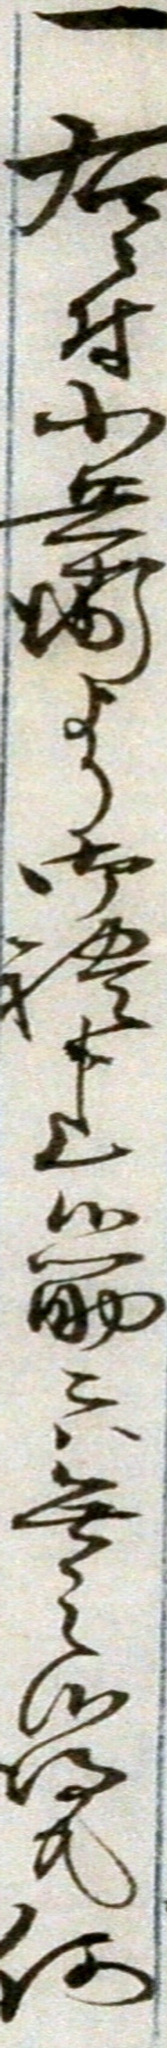一右二付小兵衛より御礼申上候筋ニハ無之候得共何
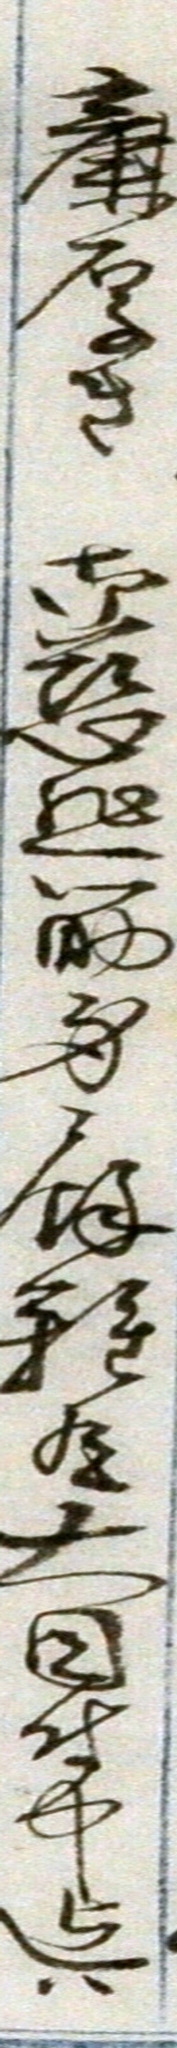厚き御慈悲筋身ニ餘難有大目付中迄ハ
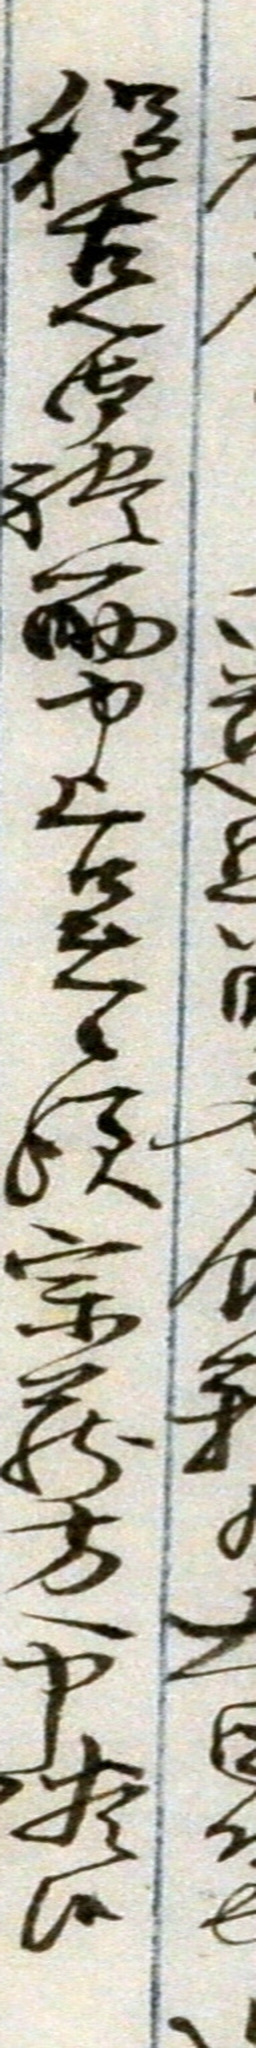程克御禮筋申上呉候様宗蔵方へ申談候
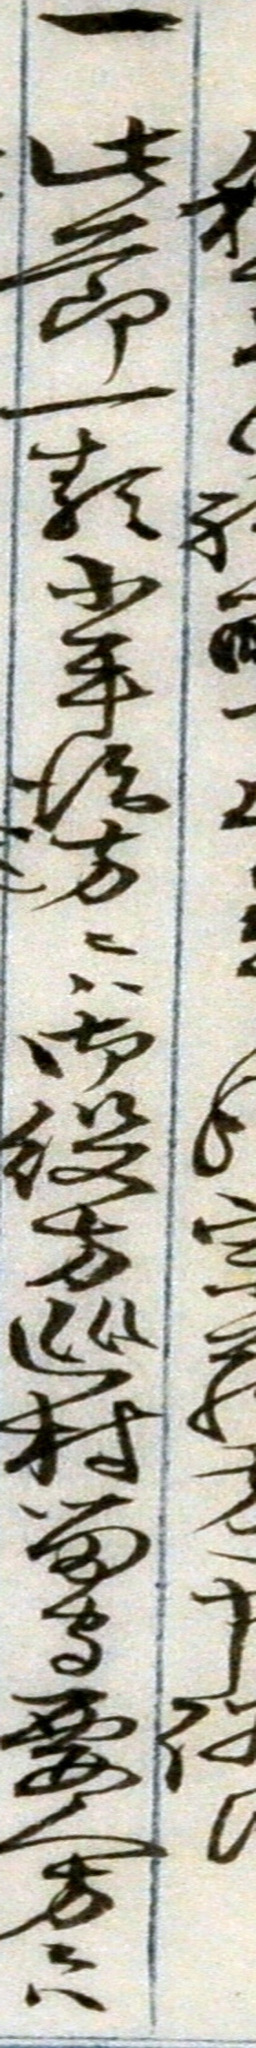一此節一類小平治方ニハ御役方巡村留守要人方ニハ
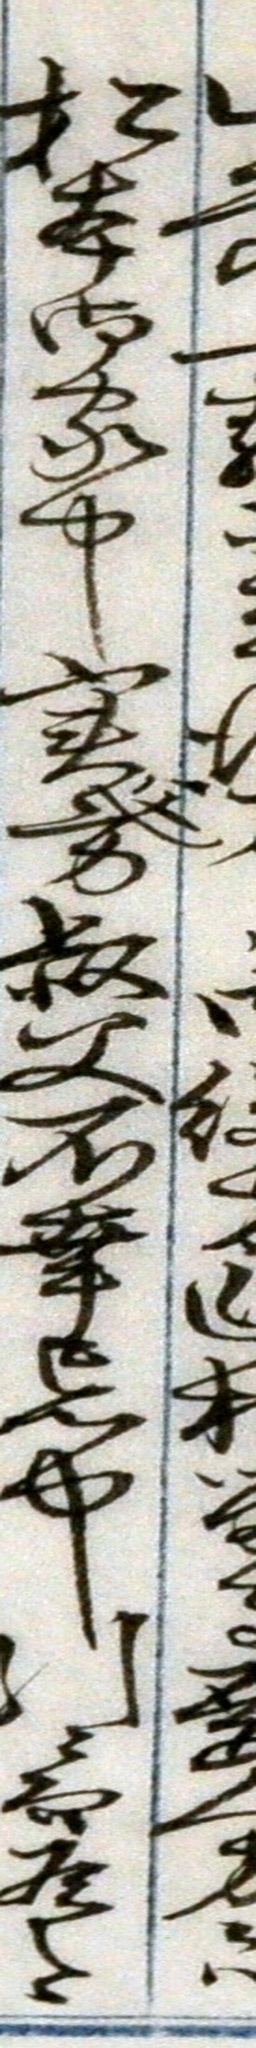松本御家中実父方叔父不幸忌中引ニ而有之候
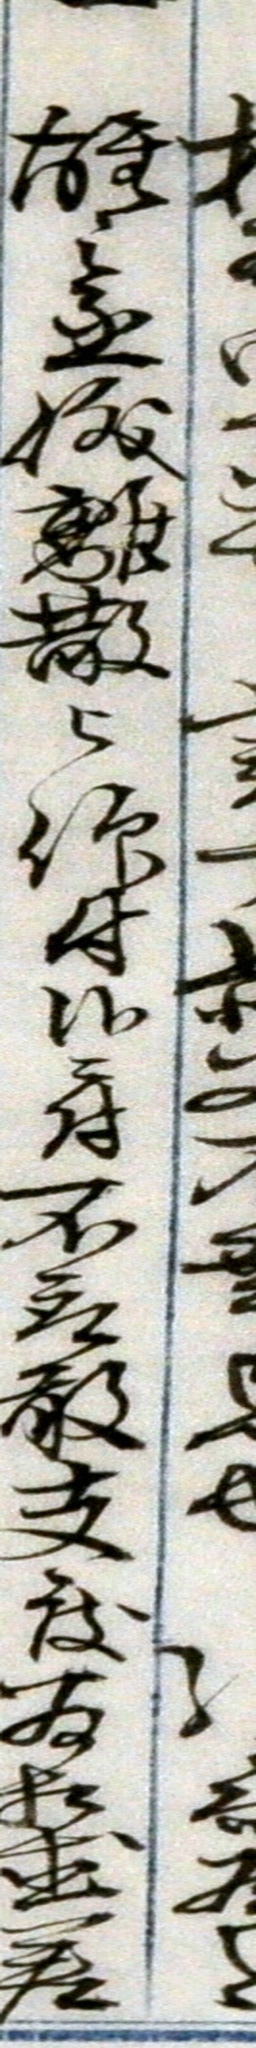一雄之丞儀離散被仰付候ニ付不取敢支度為相直差
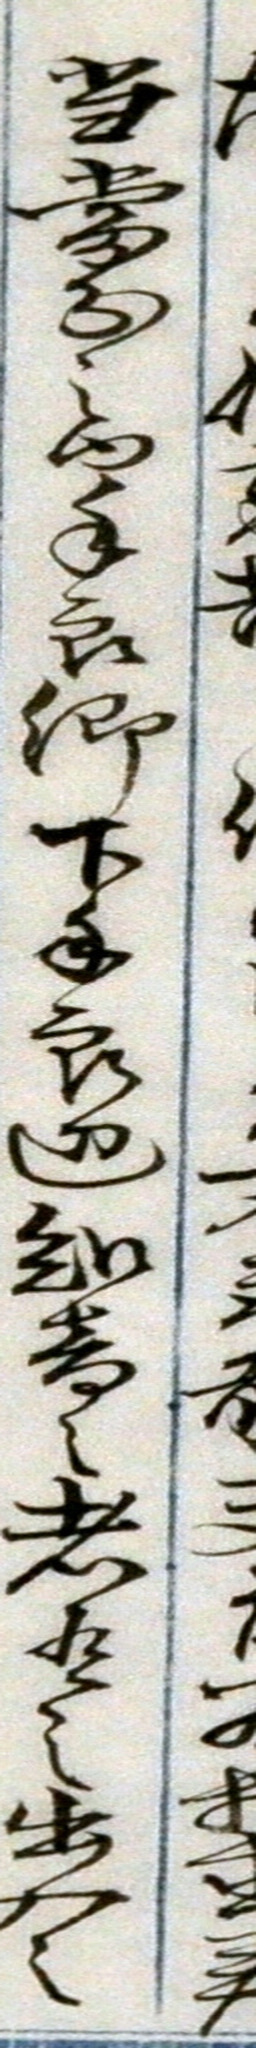当當分之内手良郷下手良辺知音之者有之出入之
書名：川面小藤太子細有之多賀谷唯右衛門ヲ打果候一件
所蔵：伊那市立高遠町図書館・合同会社AMANE
